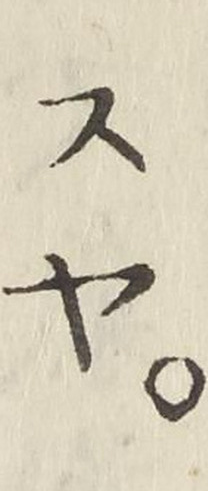スヤ。
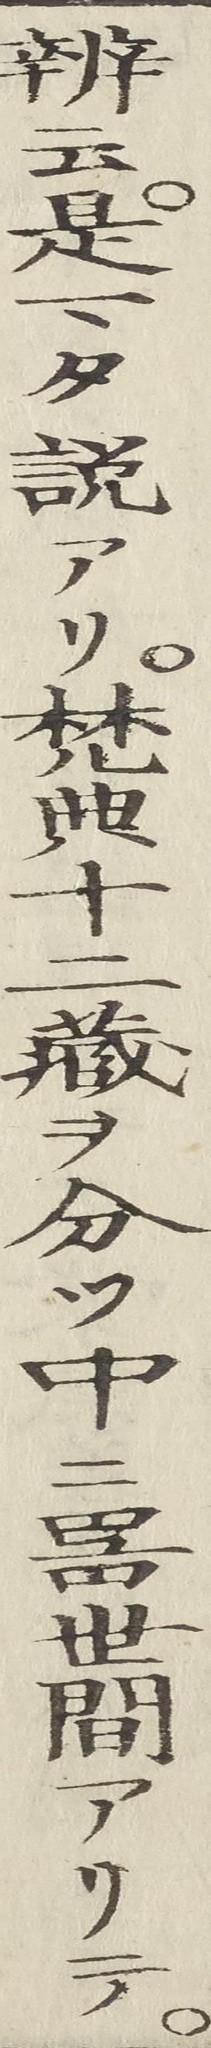弁云。是マタ説アリ。梵典十二蔵ヲ分ツ中ニ器世間アリテ。
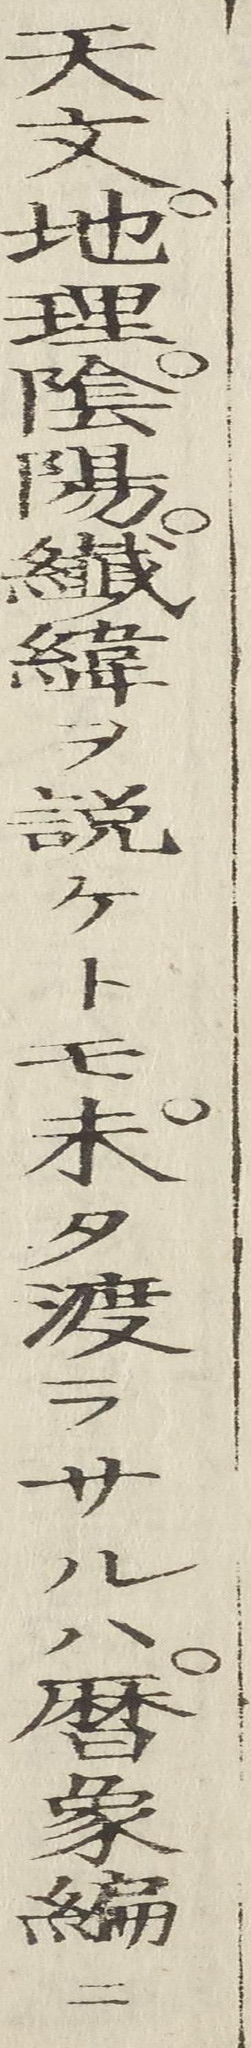天文。地理。陰陽。纎緯ヲ説ケトモ。未タ渡ラサルハ。暦象編ニ
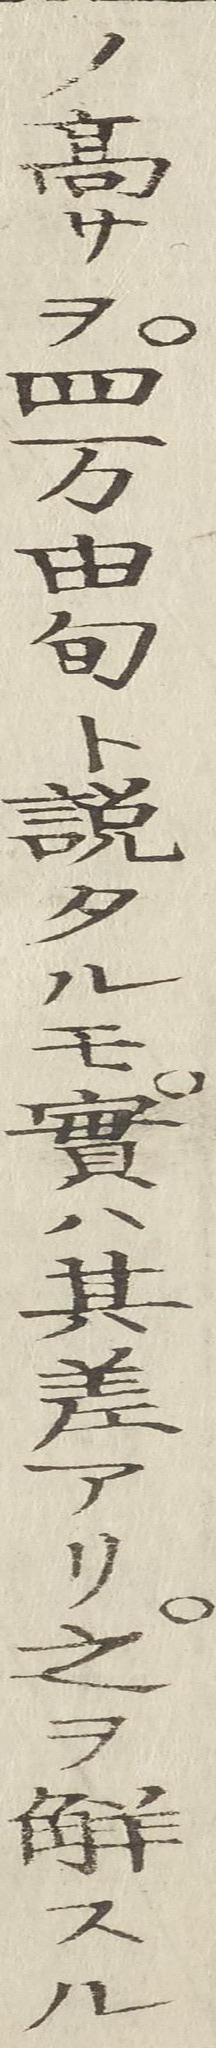ノ高サヲ。四万由旬ト説タルモ。実ハ其差アリ。之ヲ觧スル
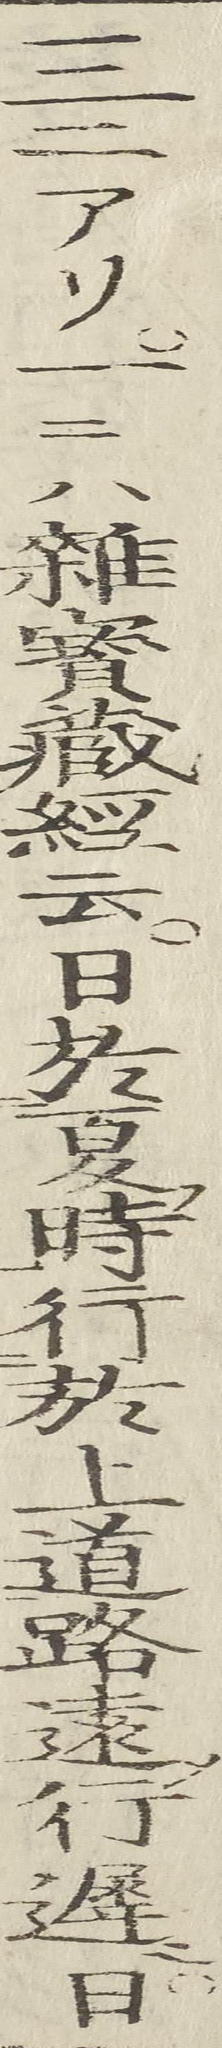三ニアリ。一ニハ雑宝蔵経云。日於ニ夏時行ニ於上道路遠行遅也。日

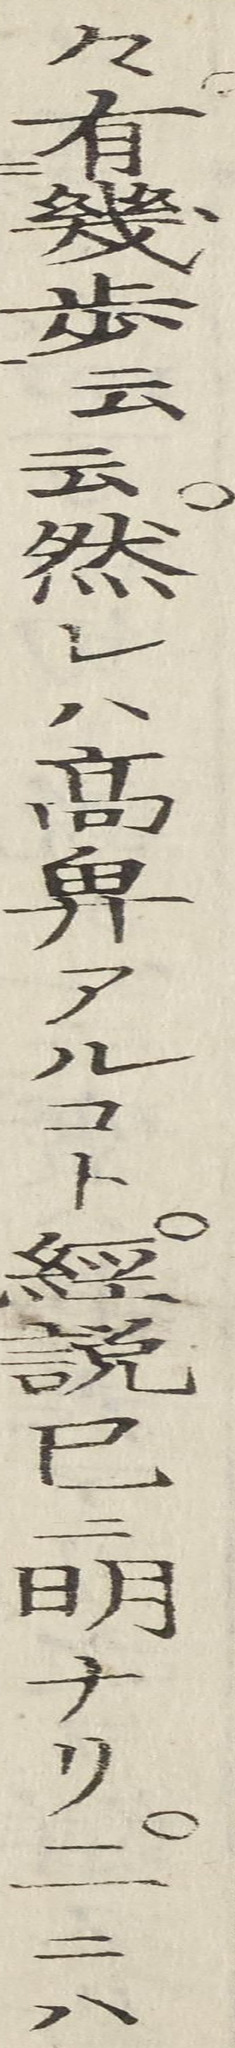々。有ニ幾歩云云。然レハ高卑アルコト。経説已ニ明ナリ。ニニハ
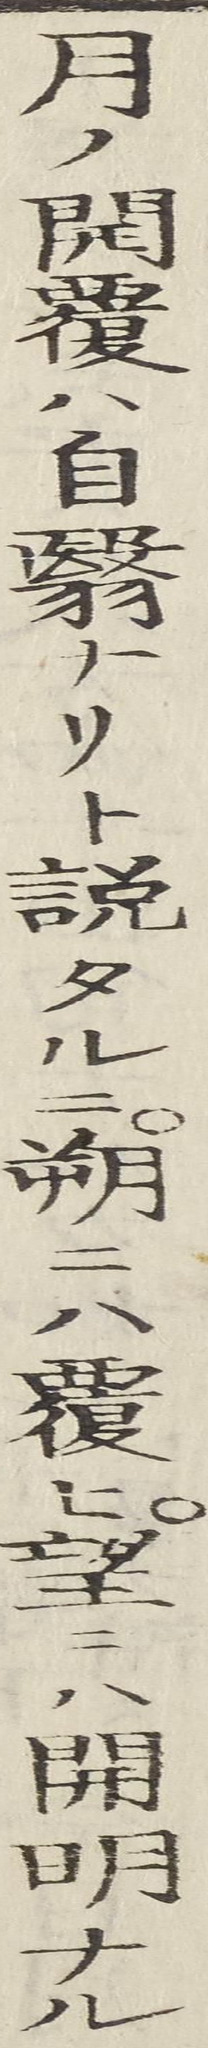月ノ開覆ハ自翳ナリト説タルニ。朔ニハ覆ヒ。望ニハ開明ナル
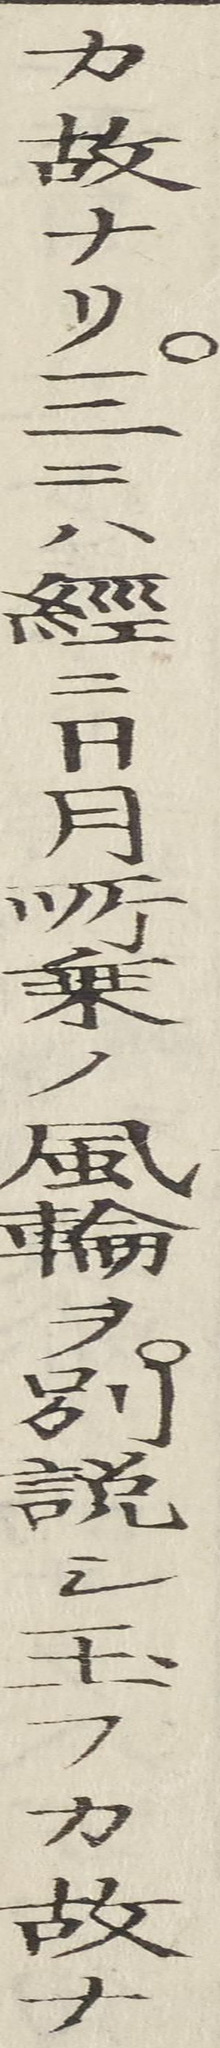カ故ナリ。三ニハ経ニ日月所乗ノ風輪ヲ。別説シ玉フカ故ナ
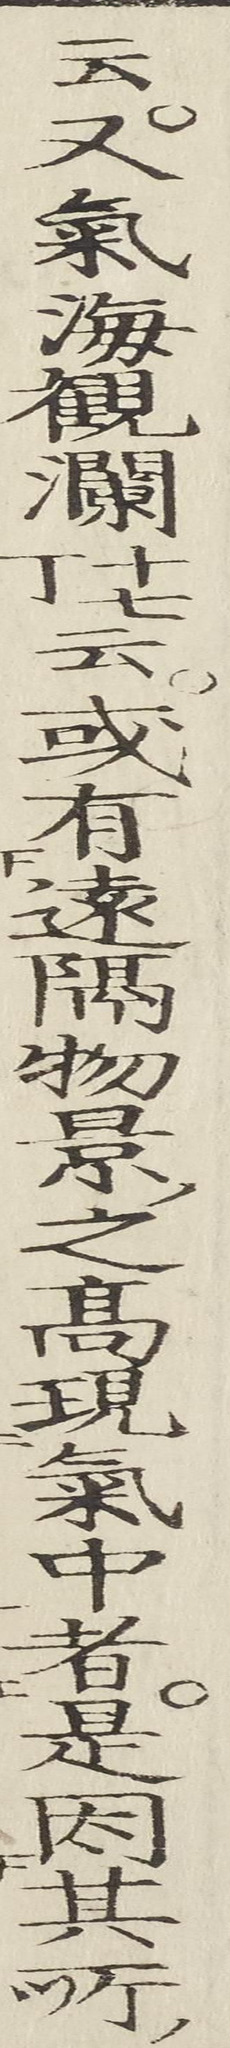云。又気海観瀾十七丁云。或有遠隔物景之高現ニ気中者。是因其所
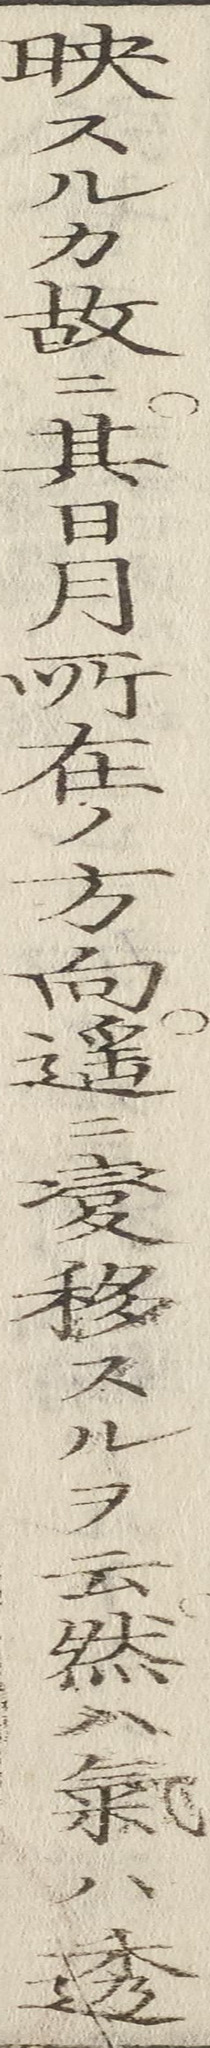映スルカ故ニ。其日月所在ノ方向。遥ニ変移スルヲ云。然ハ透
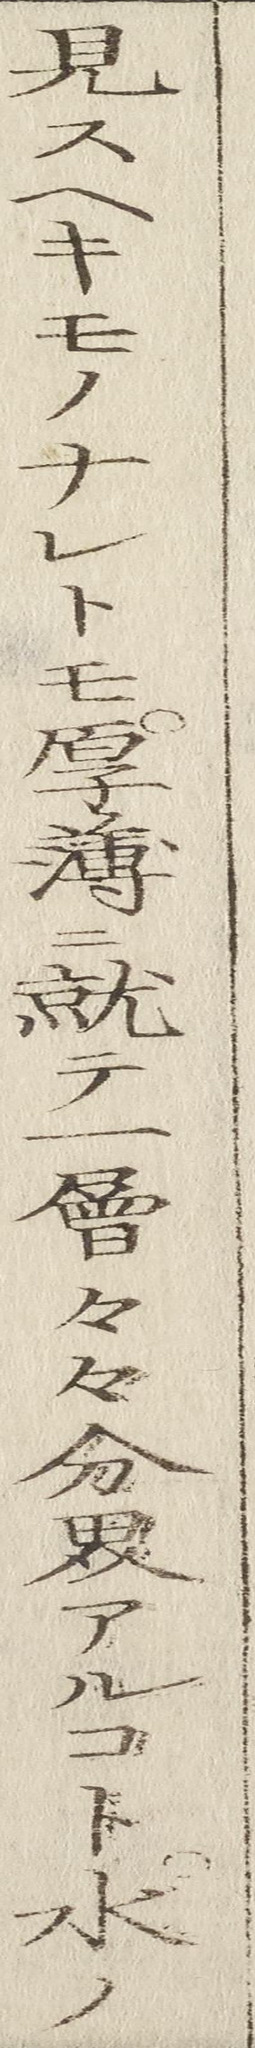見スヘキモノナレトモ。厚薄ニ就テ一層々々分界アルコト。水ノ
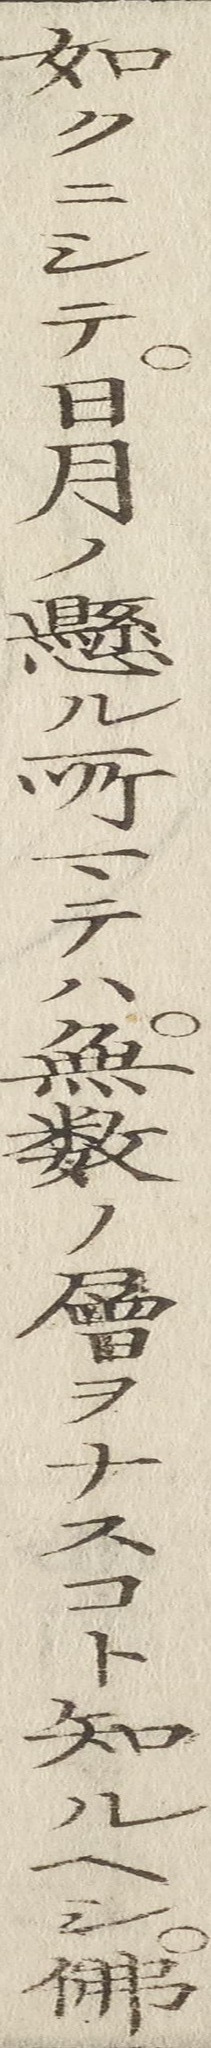如クニシテ。日月ノ懸ル所マテハ。無数ノ層ヲナスコト知ルヘシ。仏
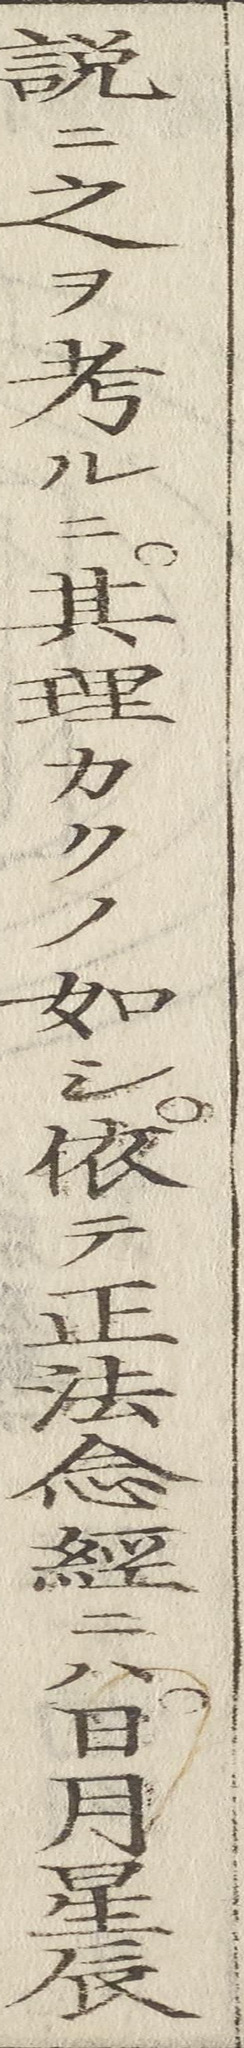説ニ之ヲ考ルニ。其理カクノ如シ。依テ正法念経ニハ。日月星辰
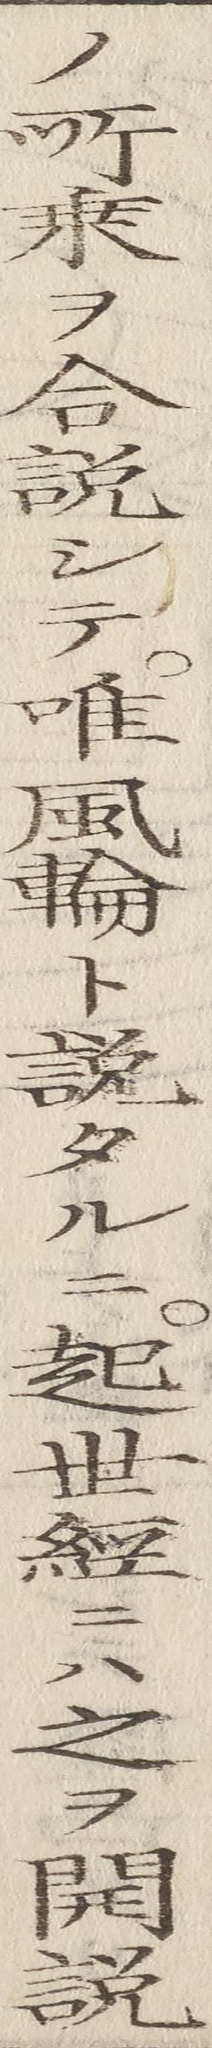ノ所乗ヲ合説シテ。唯風輪ト説タルニ。起世経ニハ之ヲ開説
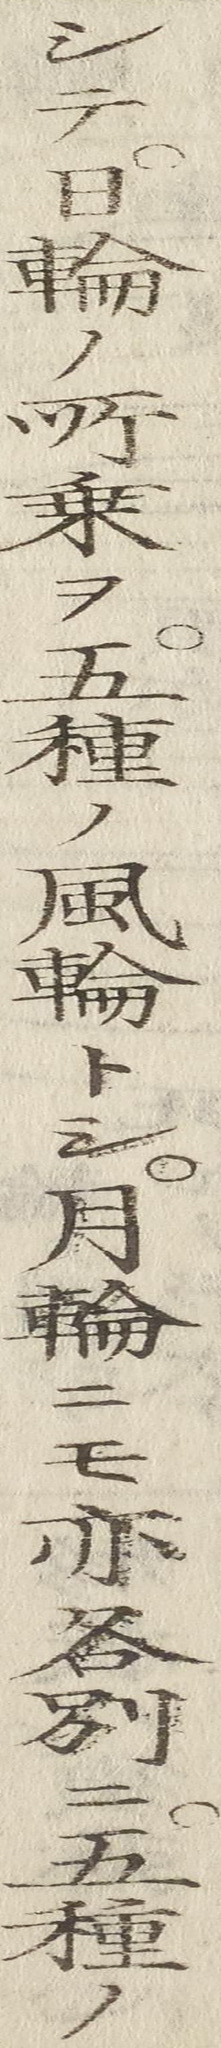シテ。日輪ノ所乗ヲ。五種ノ風輪トシ。月輪ニモ亦各別ニ。五種ノ
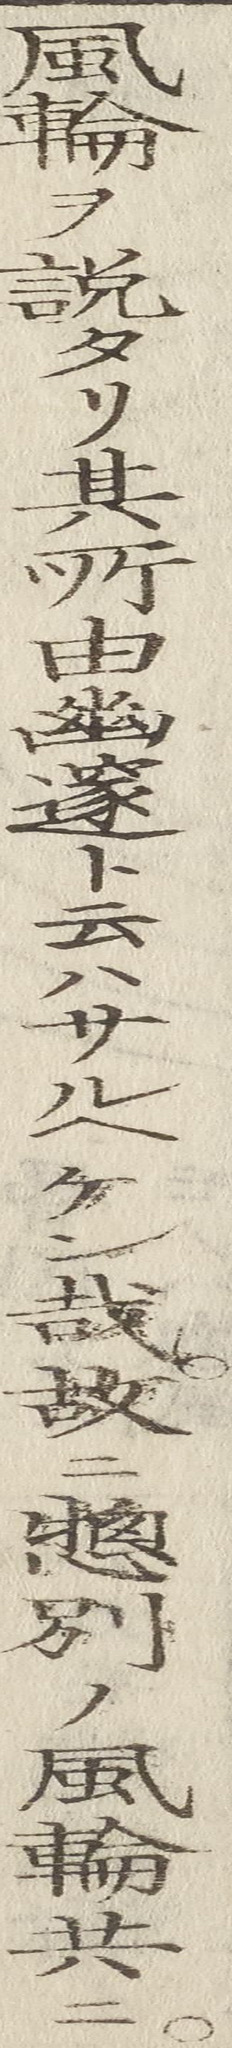風輪ヲ説タリ其所由幽邃ト云ハサルヘケン哉。故ニ惣別ノ風輪共ニ。
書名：護法新論　二編　上
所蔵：東京大学地震研究所図書室 Earthquake Research Institute Library, The University of Tokyo, JAPAN
